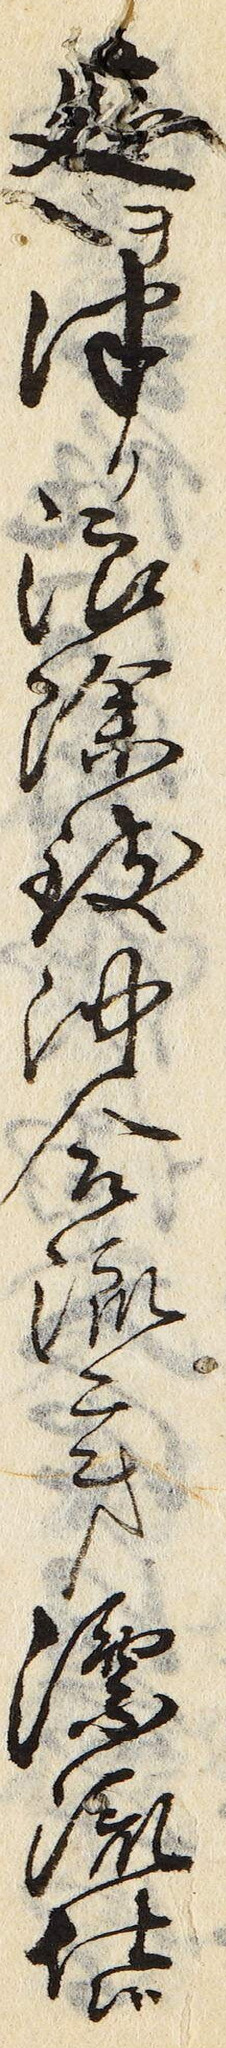莚ヲつり浪除致沖合流漂流仕候
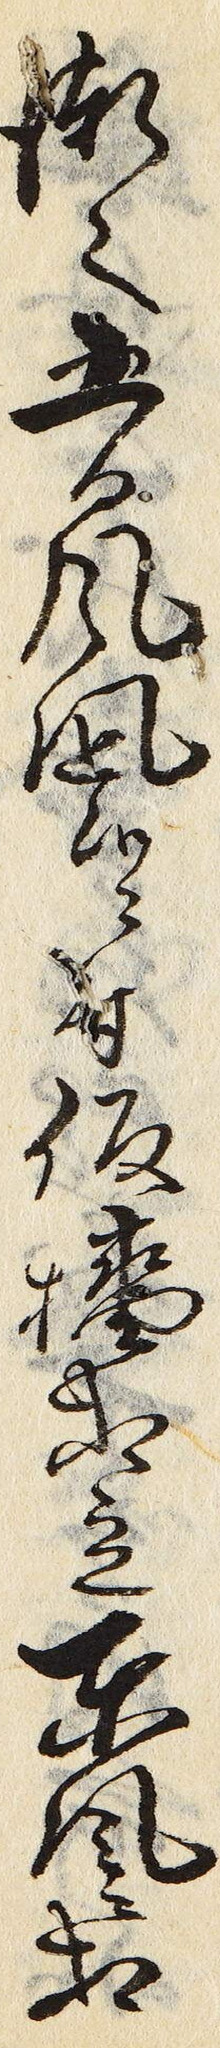漸々五日風凪候ニ付仮檣相立東風ニ相
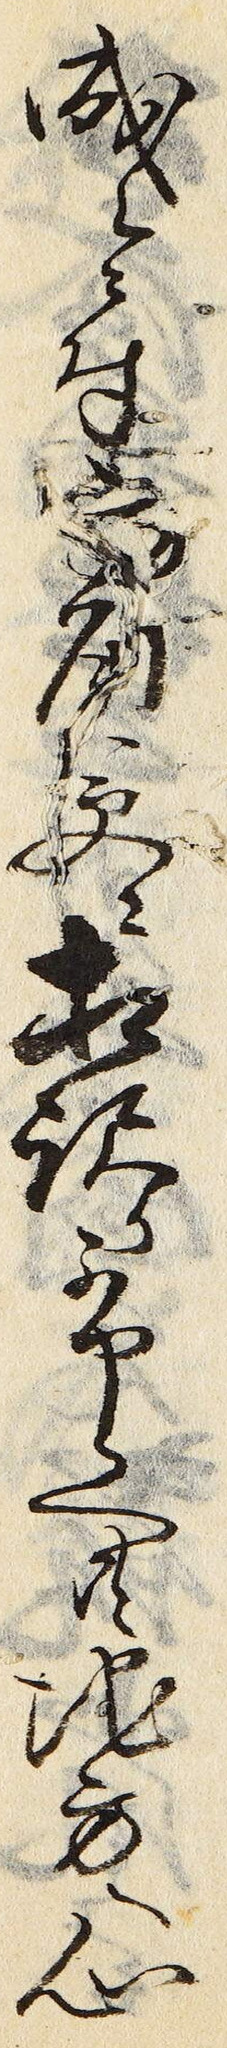成候ニ付方角ハ更ニ相訳り不申候へ共地方へ心
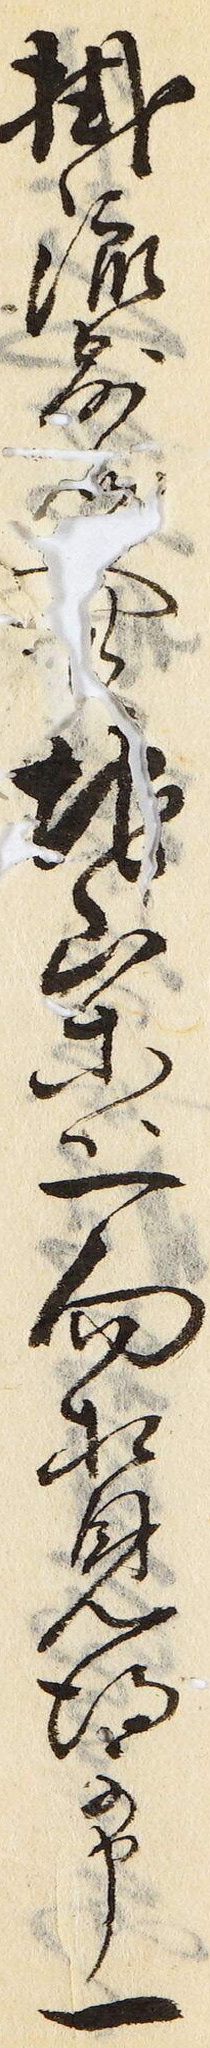掛流寄候へ共地山等ハ一向相見得不申一
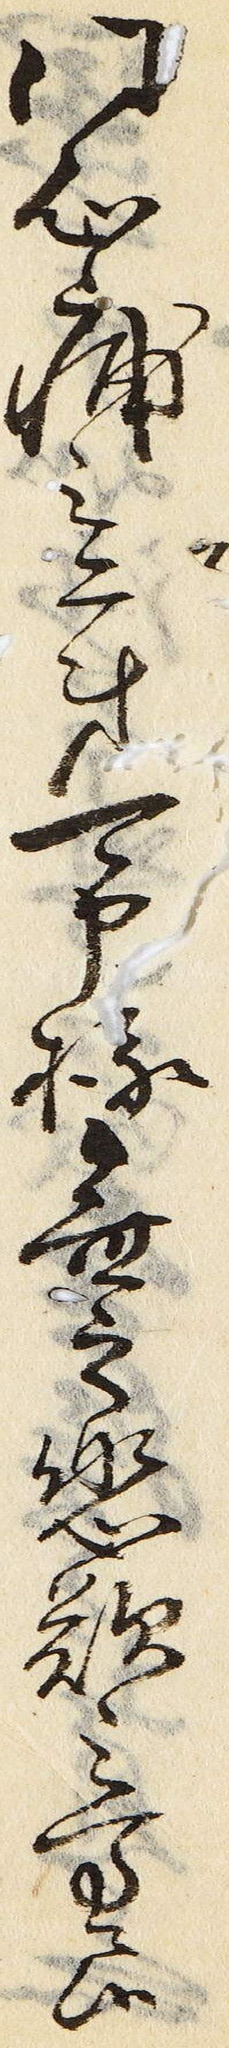同心痛之可申様無之悲歎之事ニ候
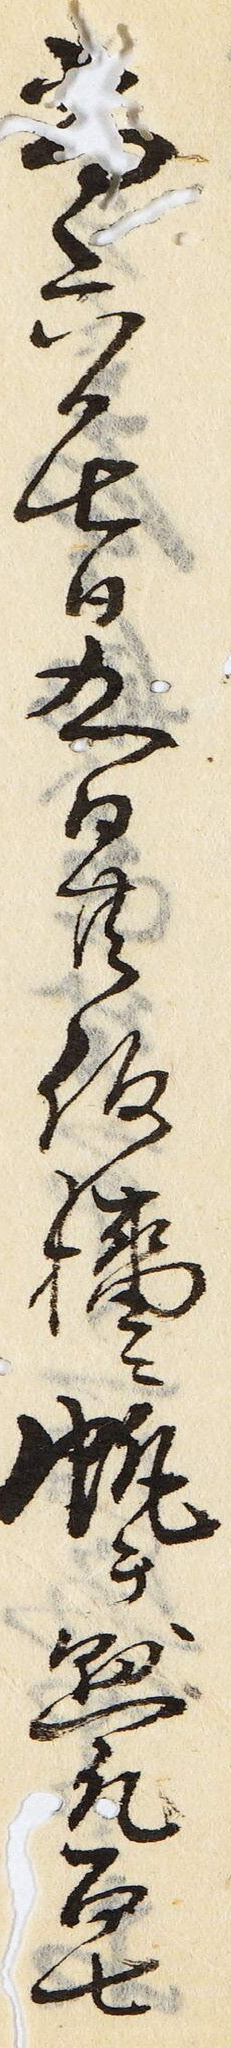当六日七日九日共仮檣ニ帆ヲ懸凡百七
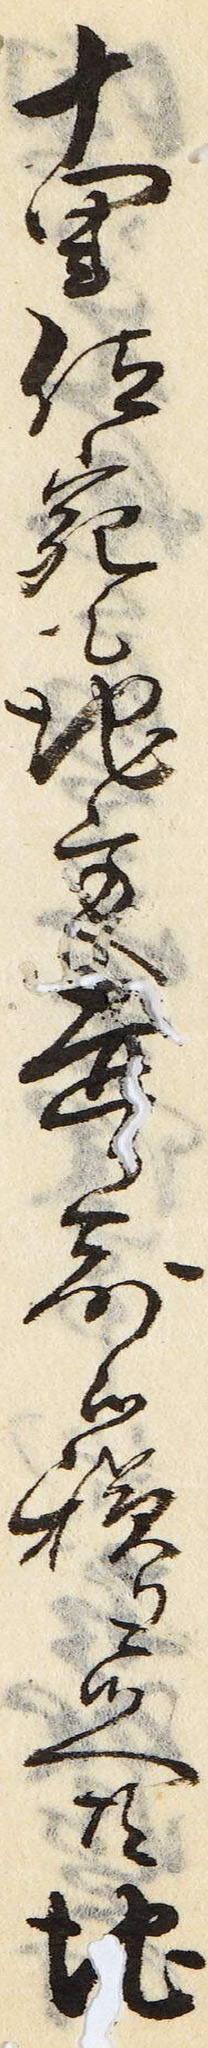十里位宛も地方へ走り寄候積り候へ共地
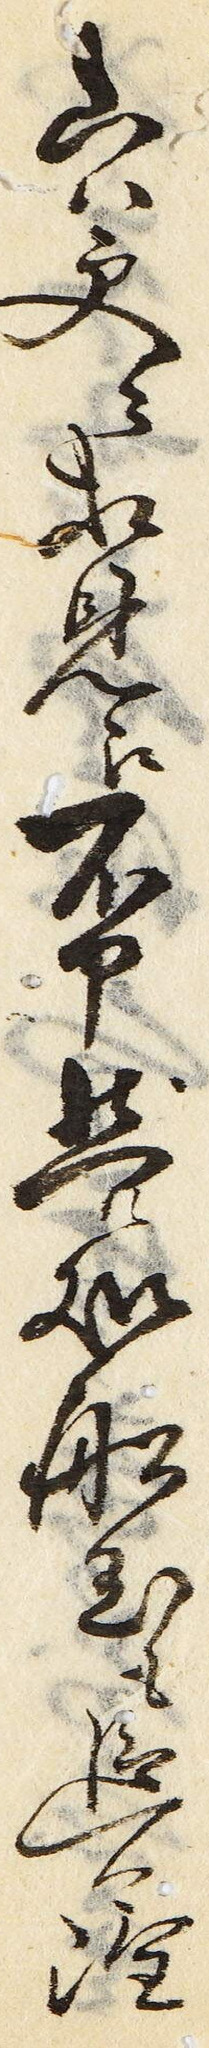山ハ更ニ相見え不申然ル処船玉も追而注
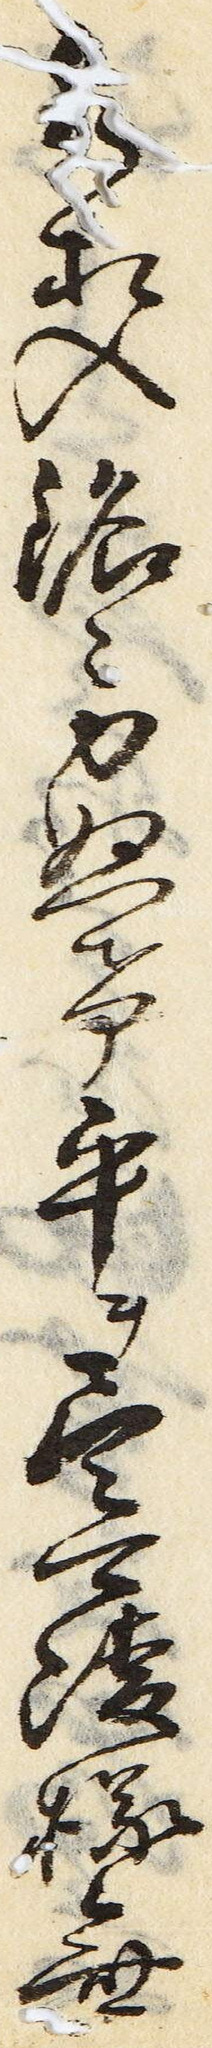水相入銘々力懸け手ヲ尽可凌様無
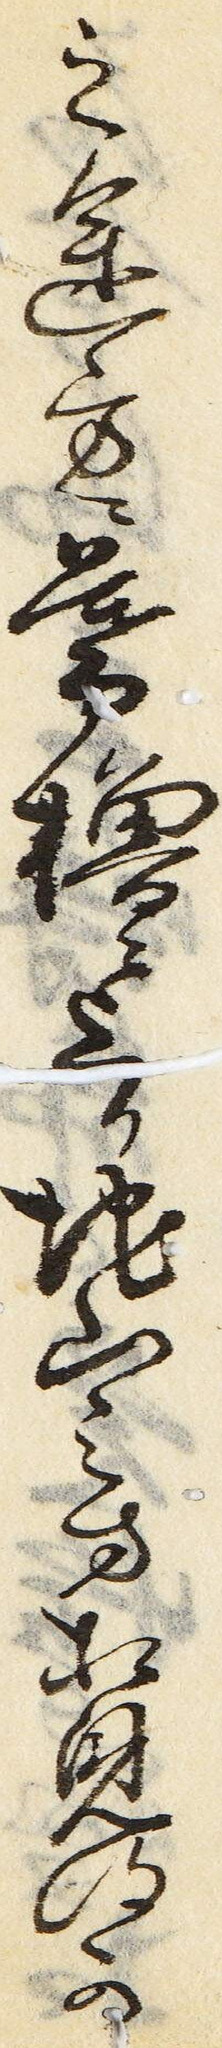之途方ニ暮櫓ニ上り地山之方相見得可
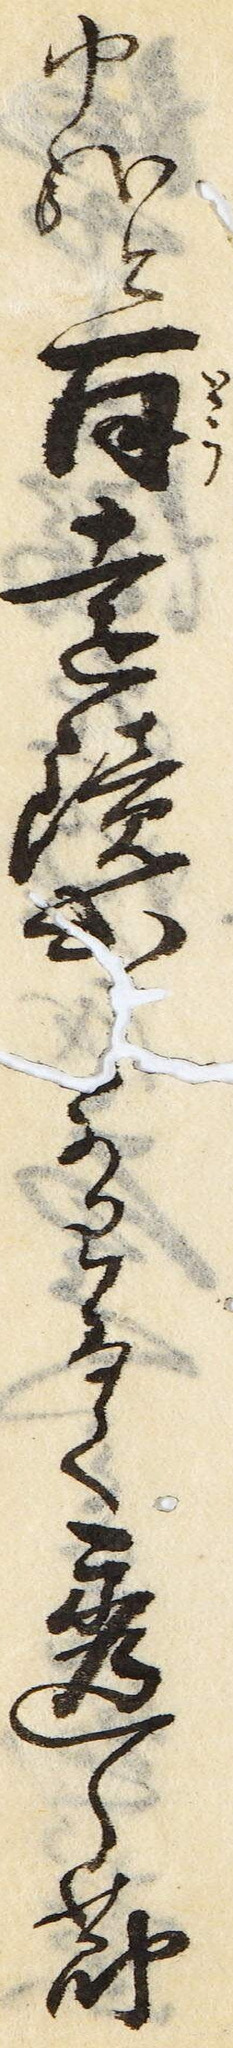申哉一同遠鏡出よりなく透し節
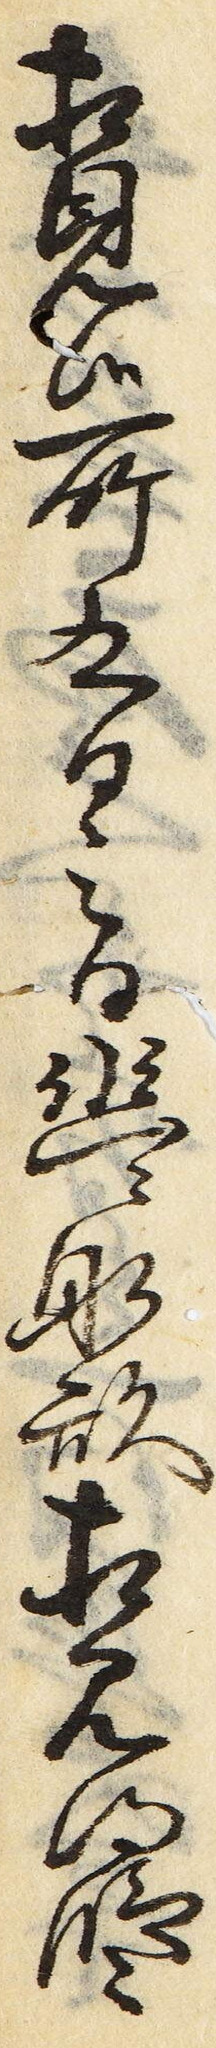相見候所九日之日幽ニ船形相見得段々

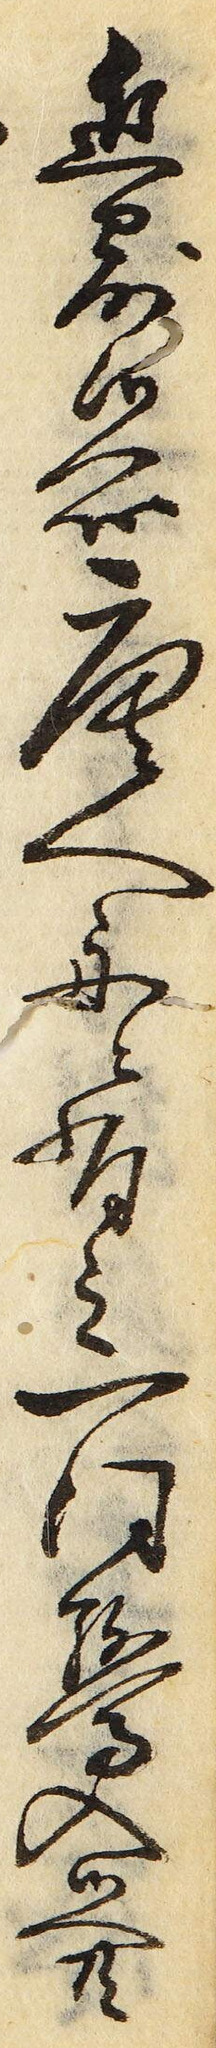近寄候所唐人舟ニ有之一同驚入候へ共
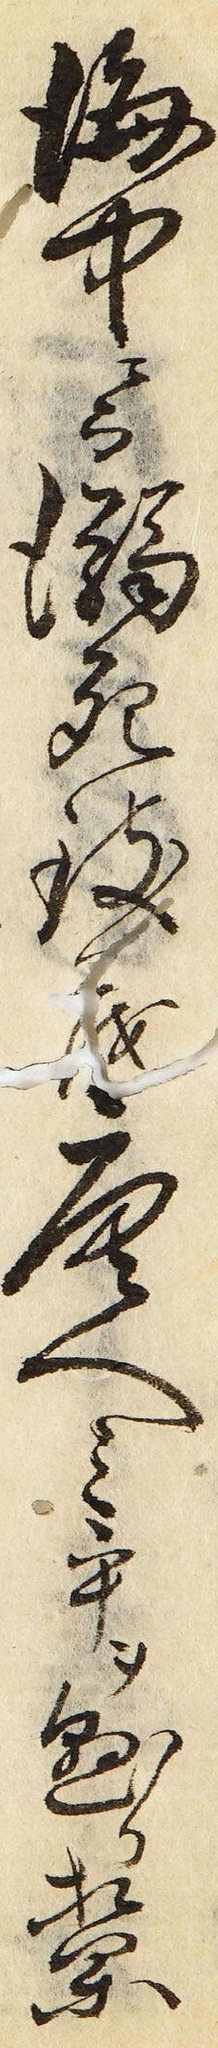海中ニ而溺死致も唐人之手ヲ懸り相果
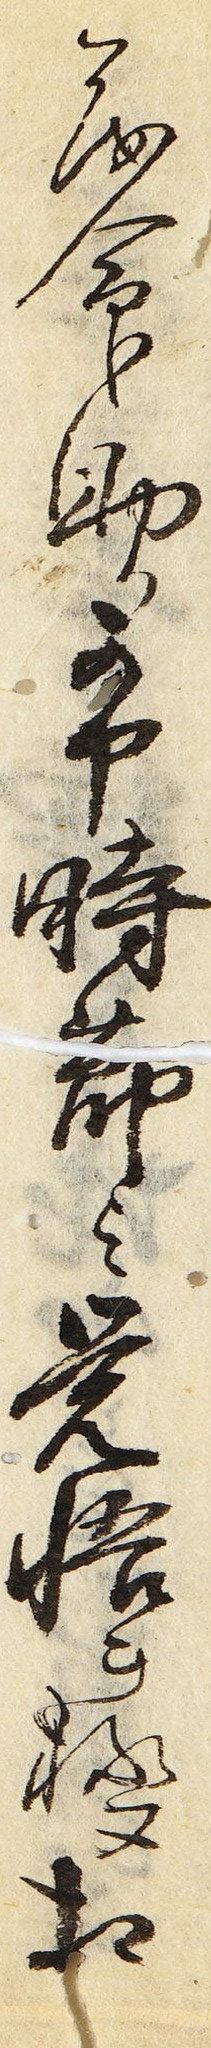も命助り不申時節与覚悟ヲ極メ相
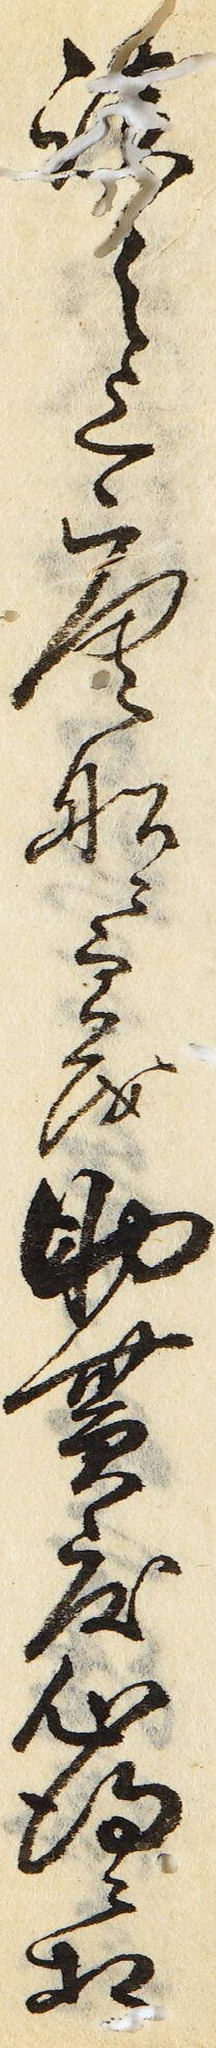談之上唐船二而も助貰度心得ニ相
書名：阿波幸宝丸漂流記
